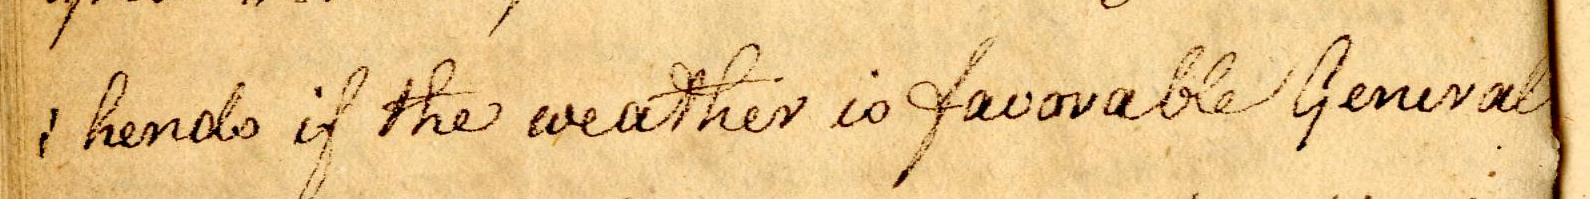-hends if the weather is favorable General
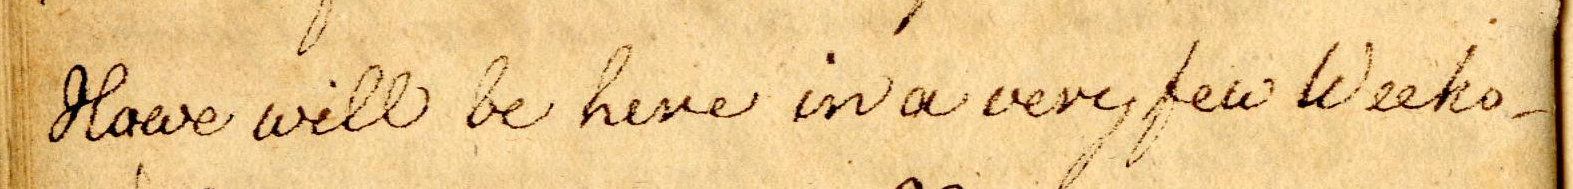Howe will be here in a very few Weeks
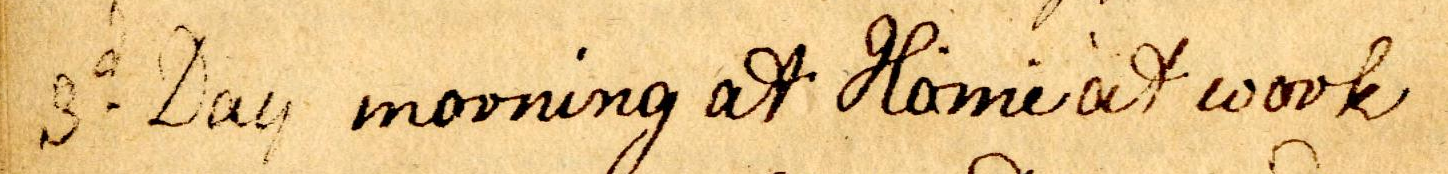3^d. Day morning at Home at work
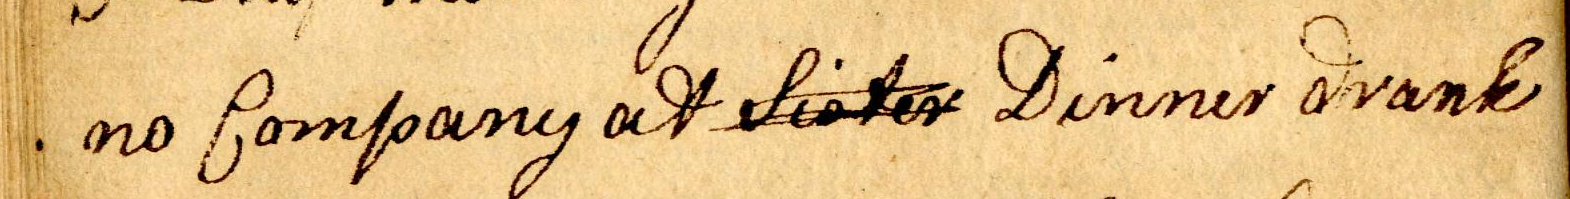no Company at [Sister] Dinner drank
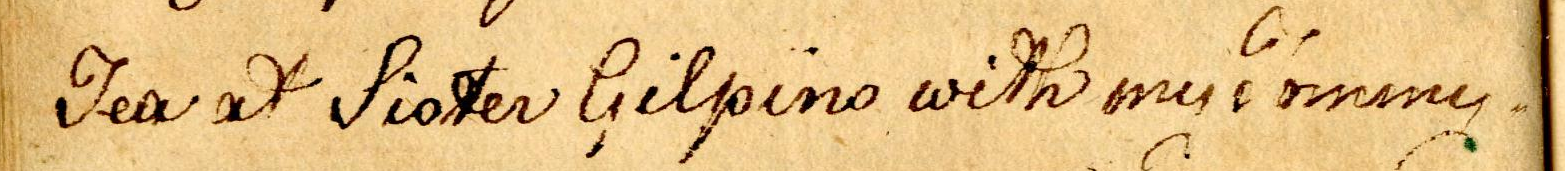Tea at Sister Gilpins with my Tommy
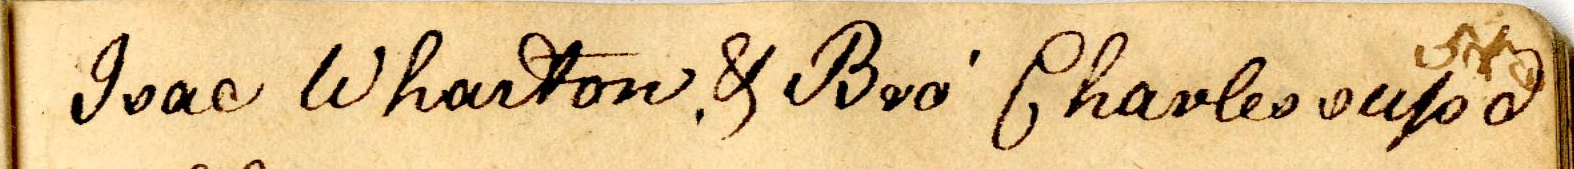Isac Wharton, & Bro' Charles sup'd
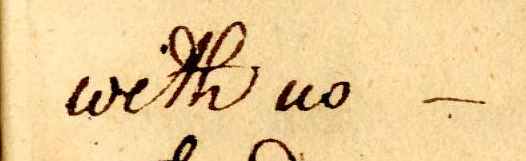with us-
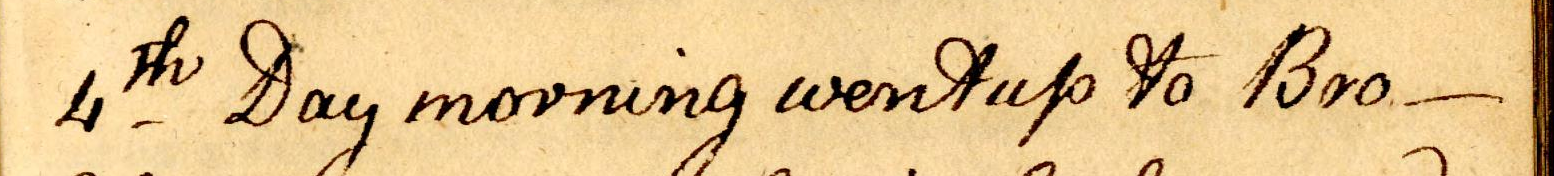4^th Day morning went to Bro-
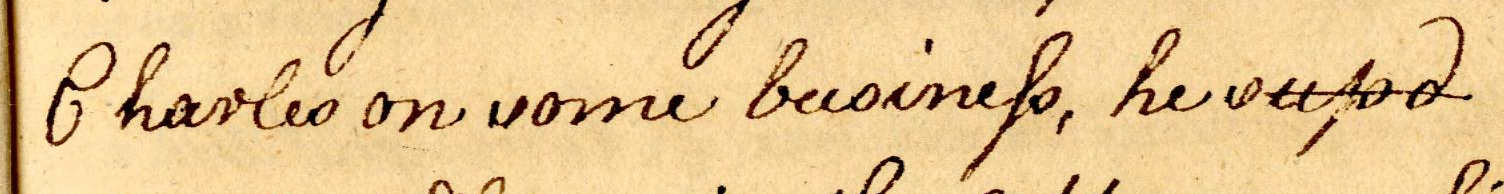Charles on some business, he sup'd
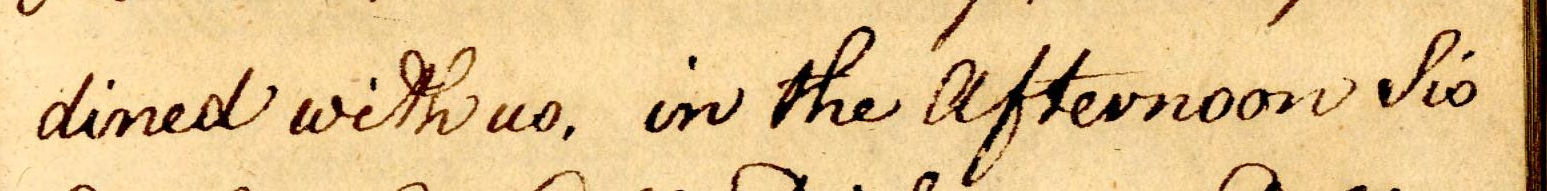dined with us, in the Afternoon Sis
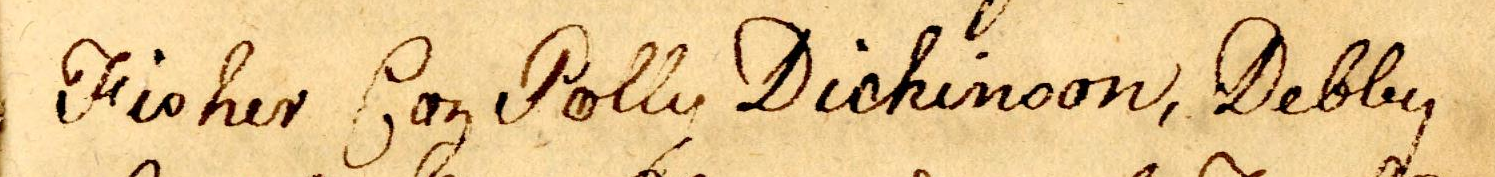Fisher Coz Polly Dickinson, Debby
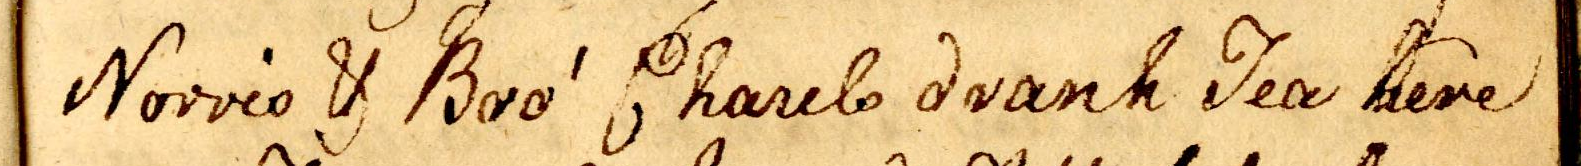Norris & Bro' Charels drank Tea here
